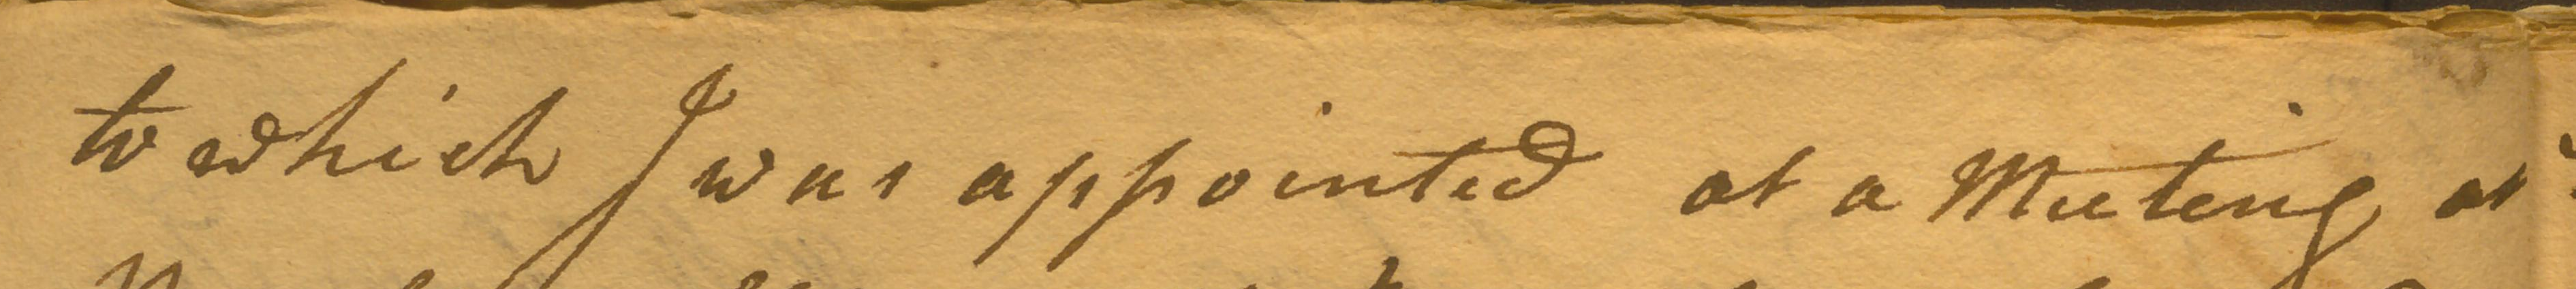to which /was appointed at a Meeting at
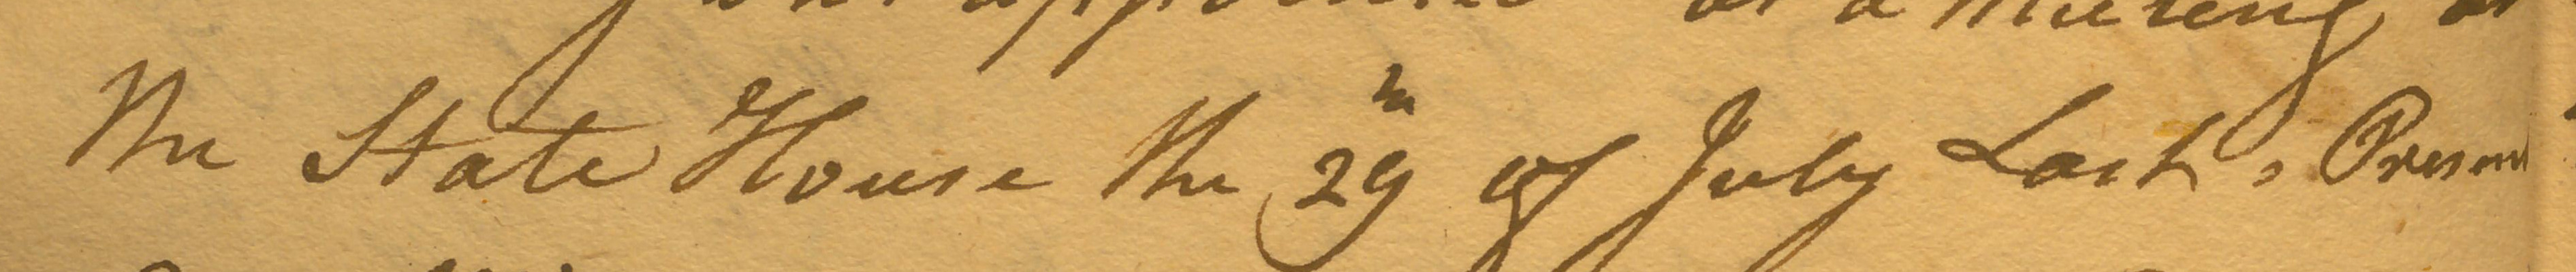the State House the 29^th of July Last. Present
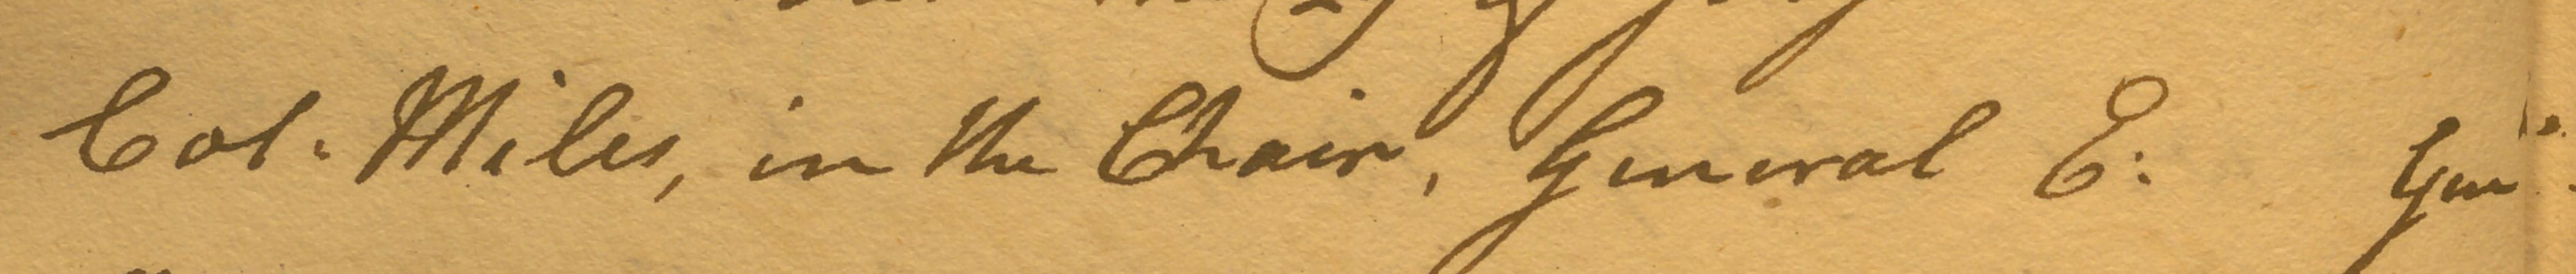Col. Miles, in the Chair. General E: Gen
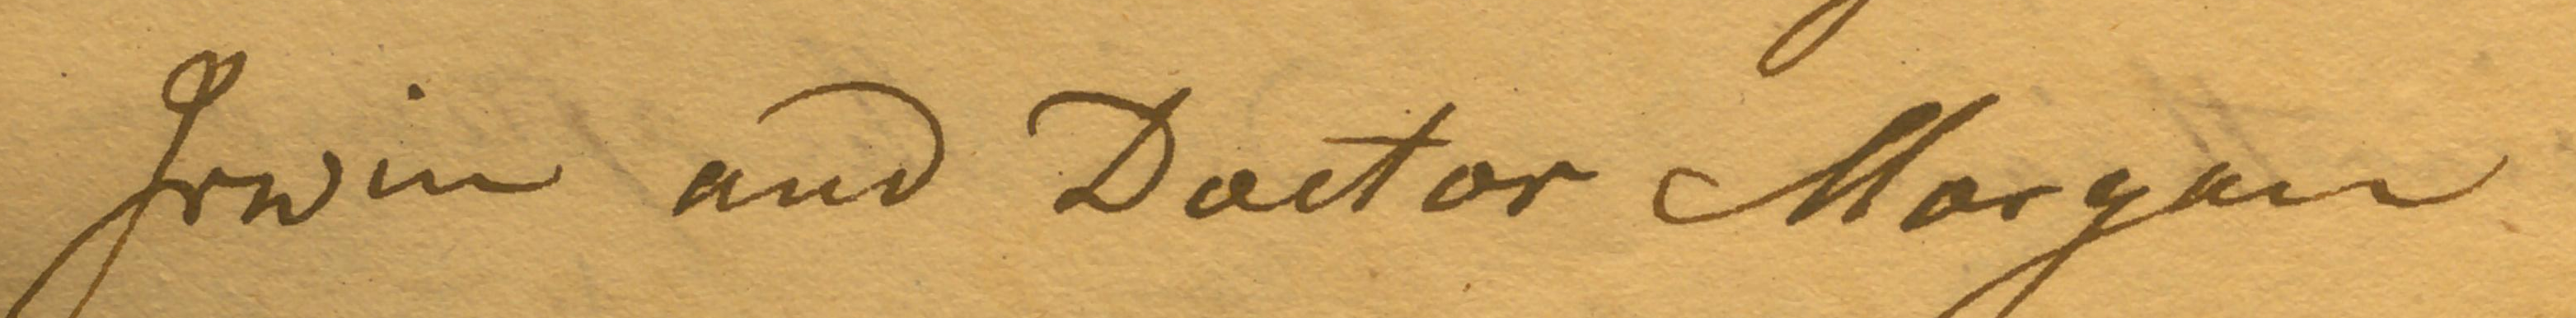Irwin and Doctor Morgan
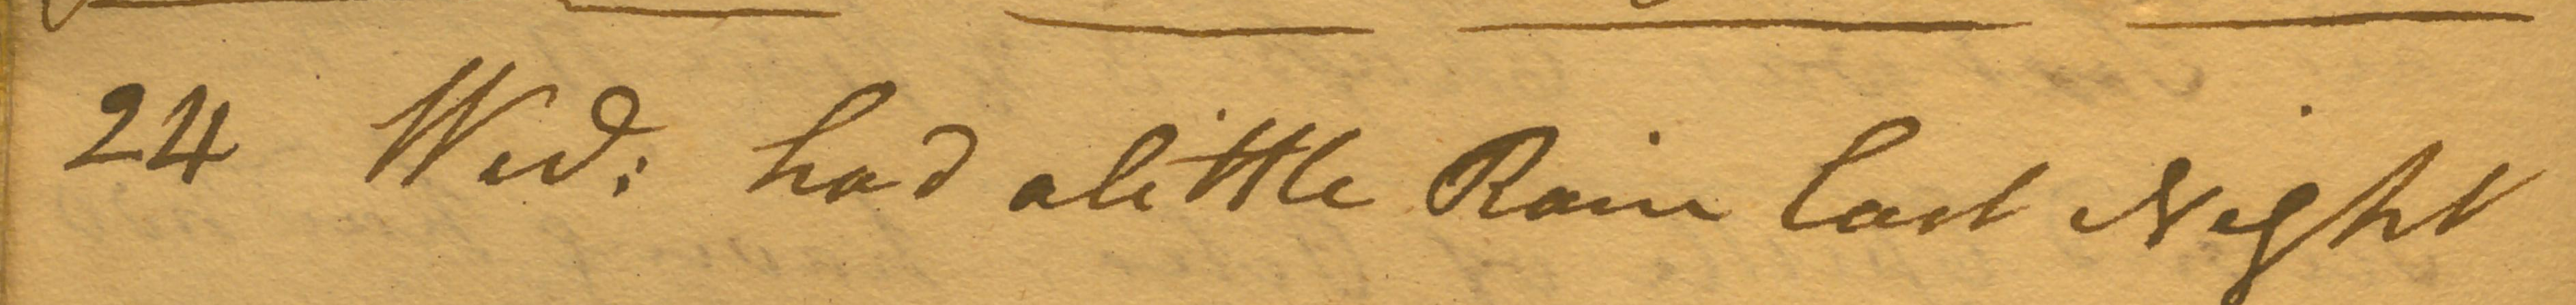24 Wed: had a little Rain last Night
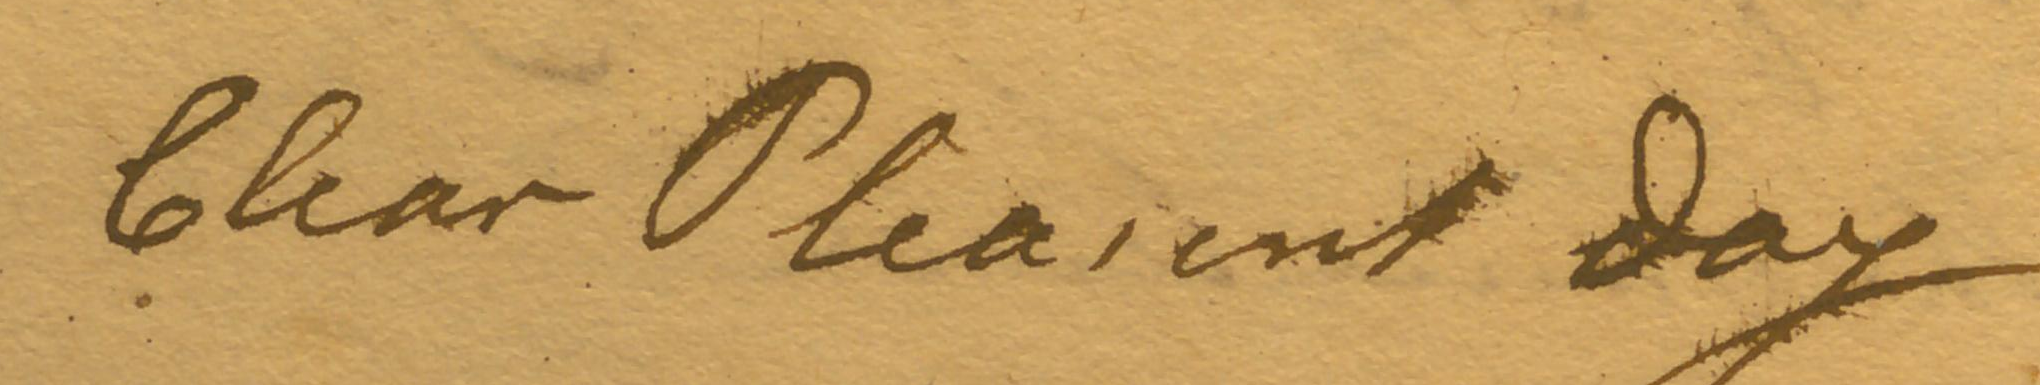Clear Pleasent day
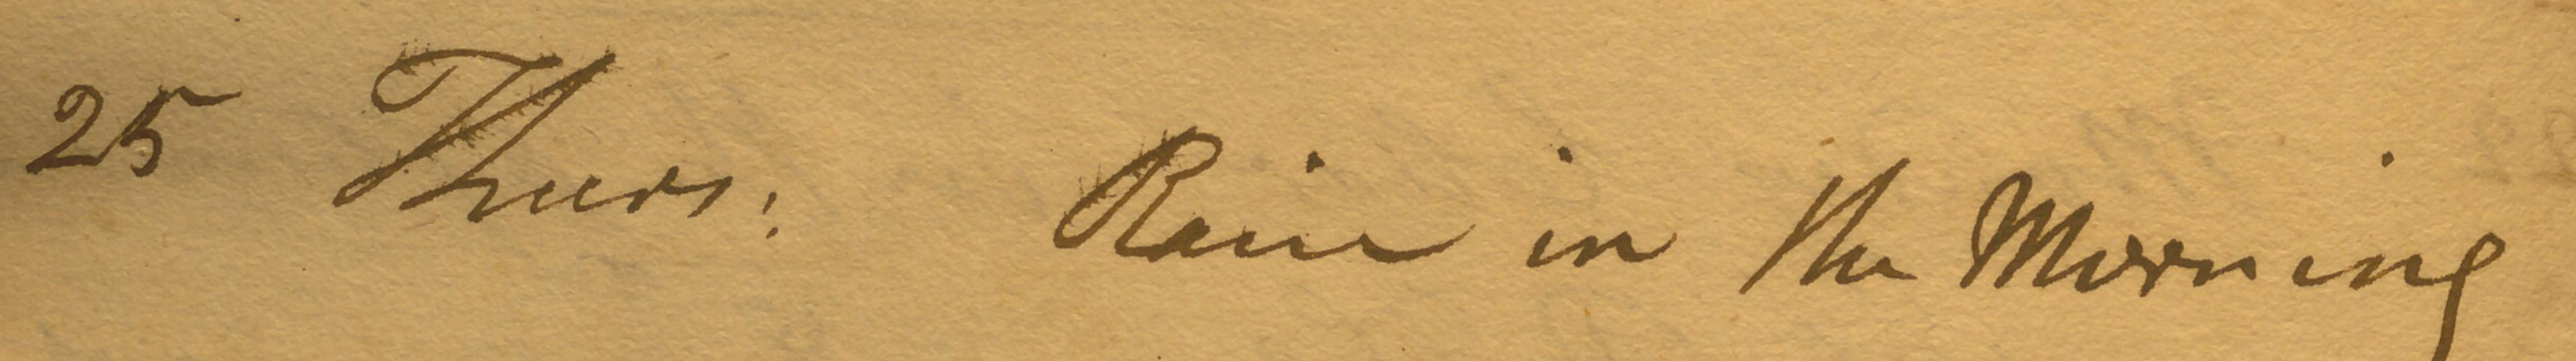25 Thurs. Rain in the Morning
